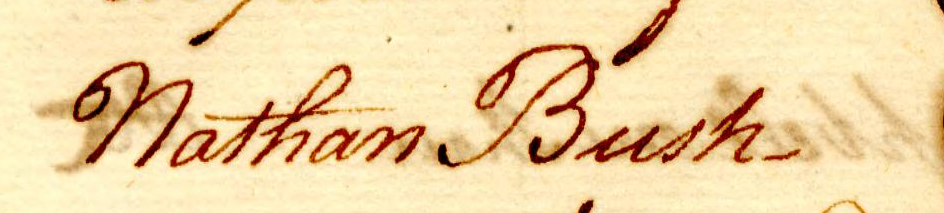Nathan Bush
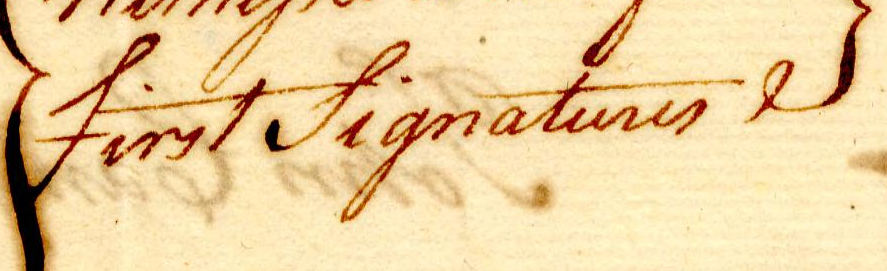First Signatures
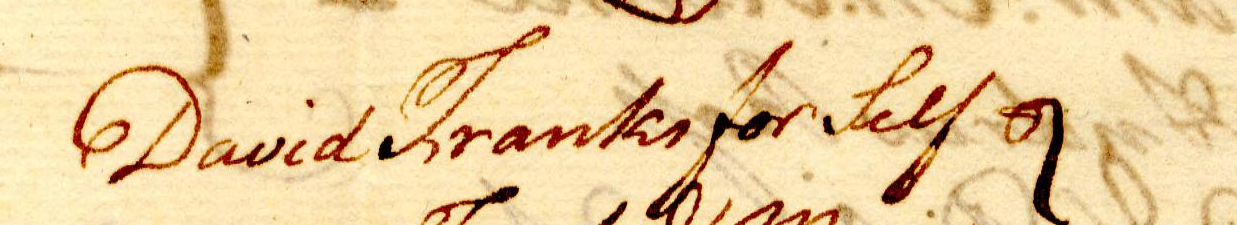David Franks for Self
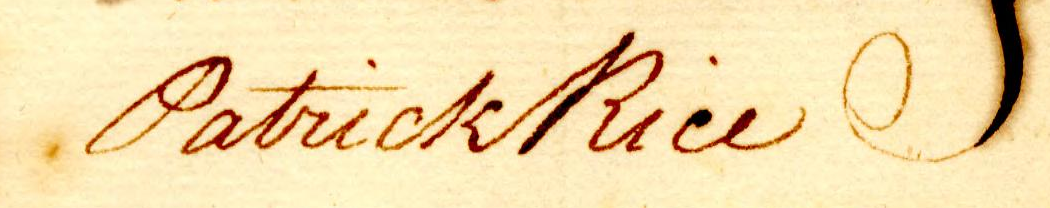Patrick Rice
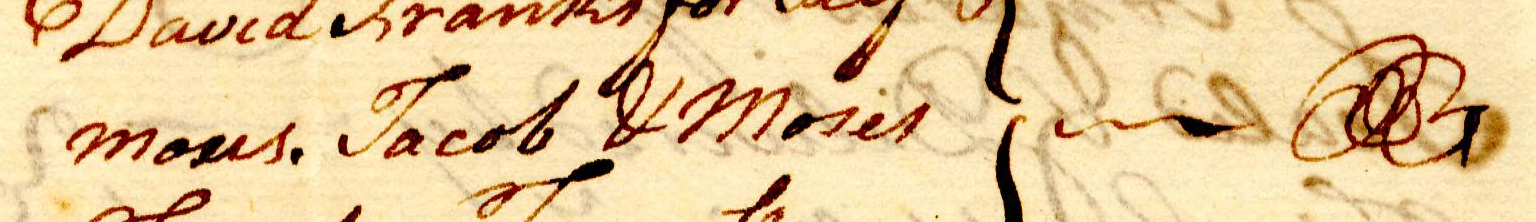mess^s. Jacob & Moses
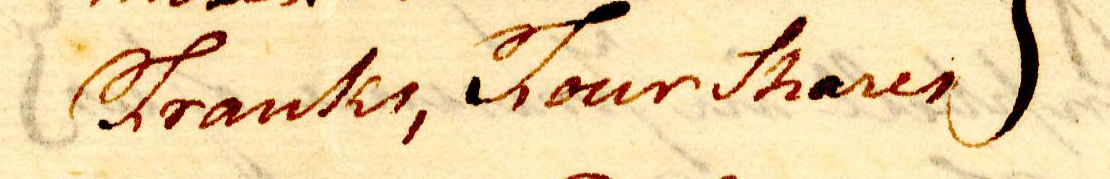Franks, Four shares
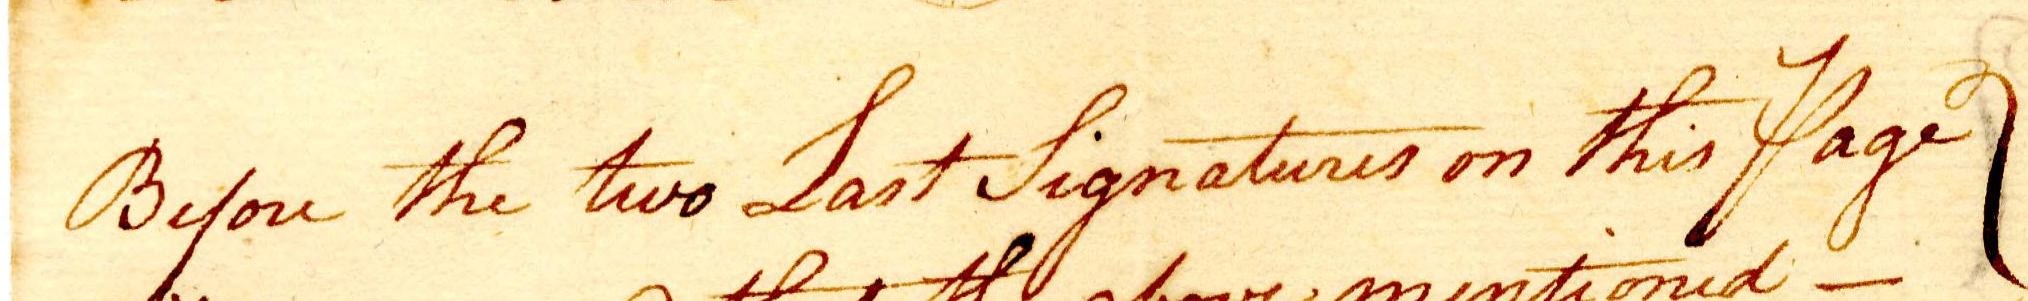Before the two Last Signatures on this page
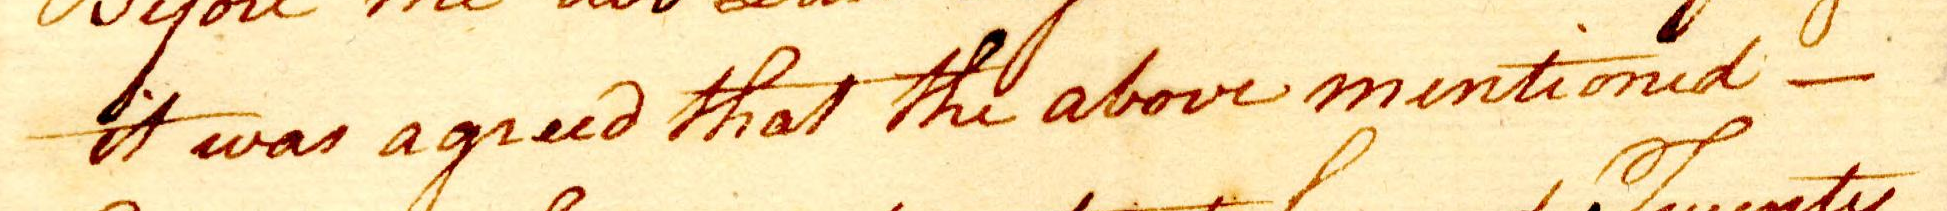it was agreed that the above mentioned-
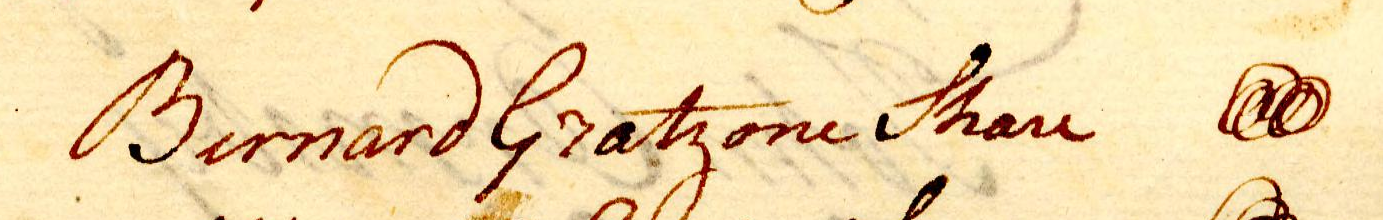Bernard Gratz one Share
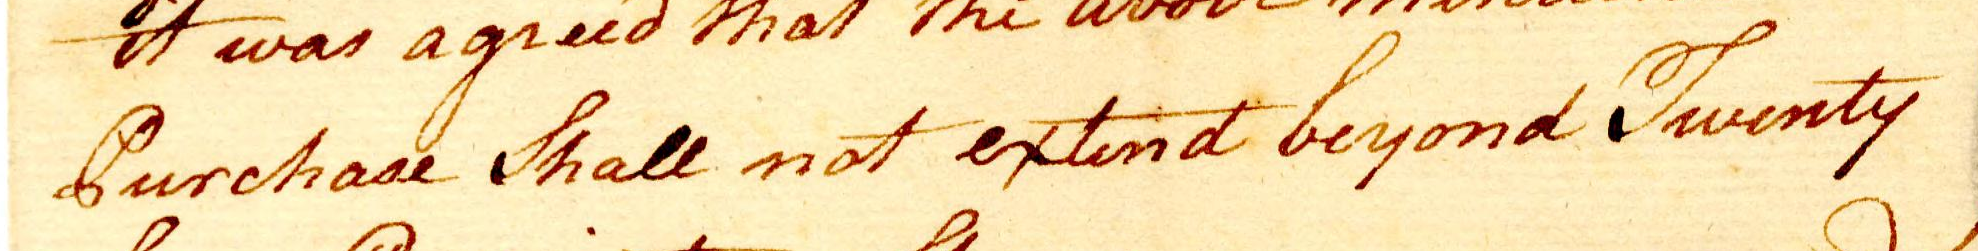Purchase Shall not extend beyond Twenty
